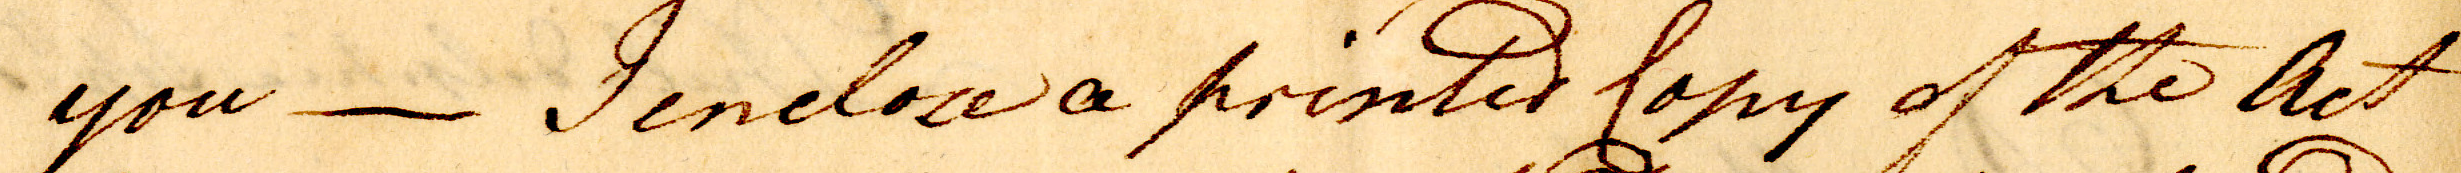you- I enclose a printed Copy of the Act
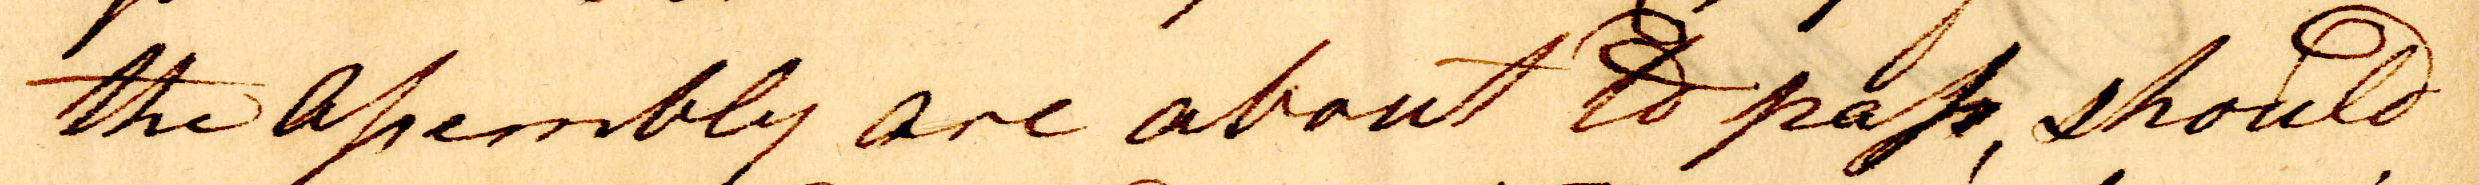the Assembly are about to pass, should
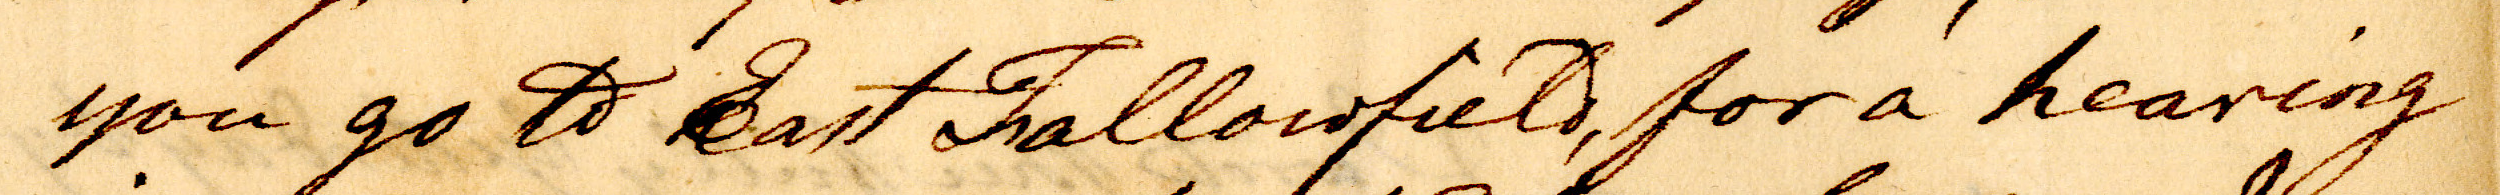you go to East Fallowfield, for a hearing
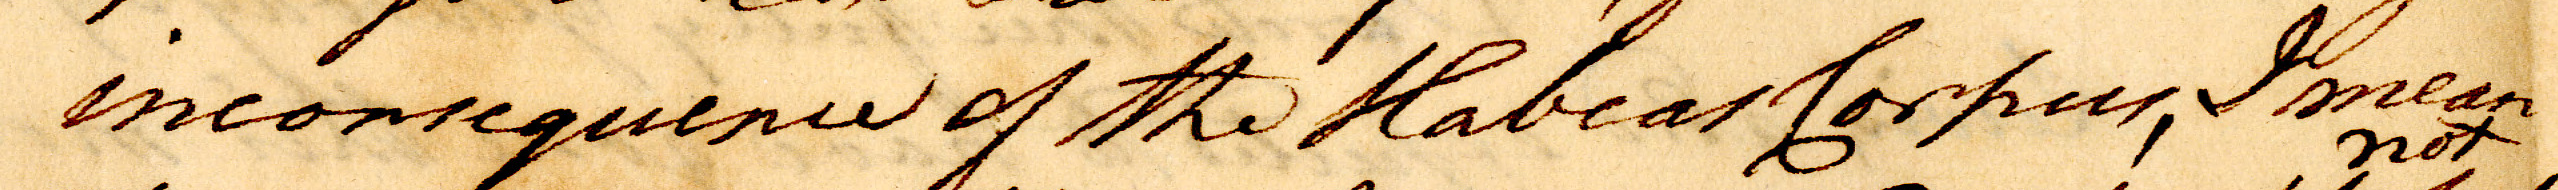inconsequence of the Habeas Corpus, I mean
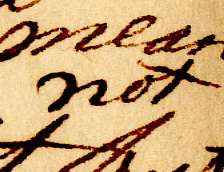not
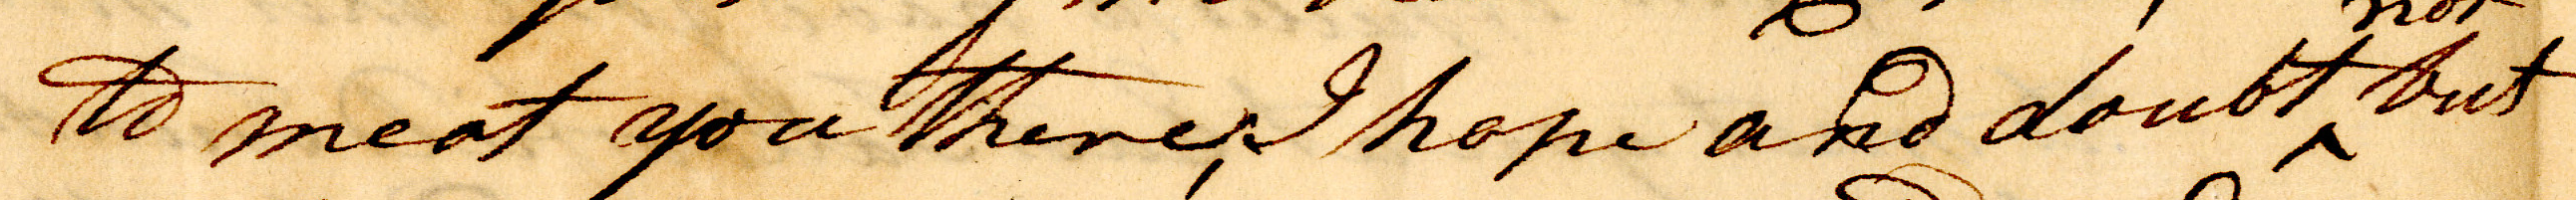to meet you there, I hope and doubt ^ but
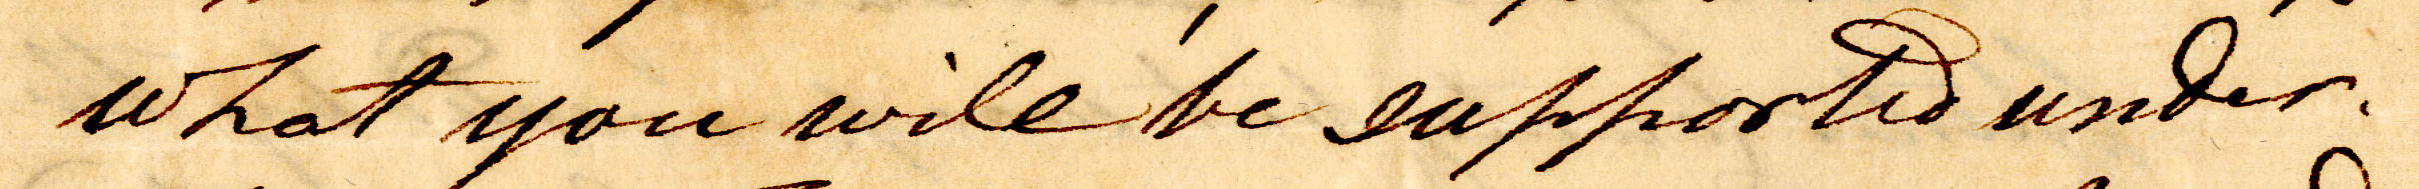what you will be supported under
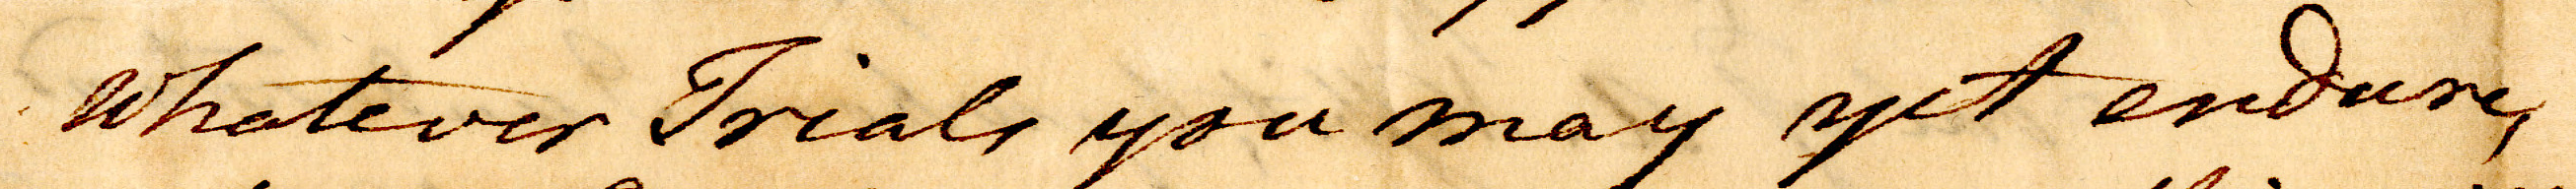whatever Trials you may yet endure,
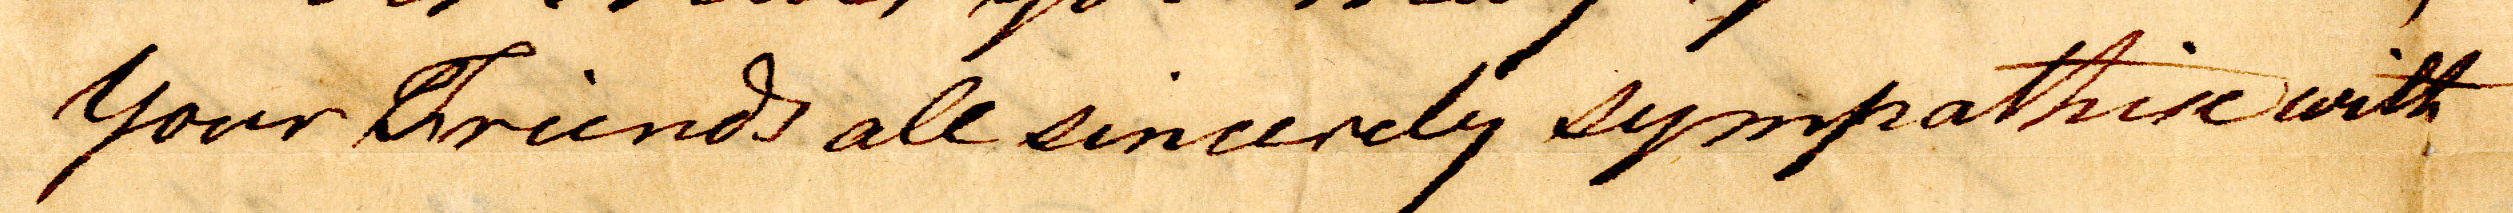Your Friends all sincerely sympathise with
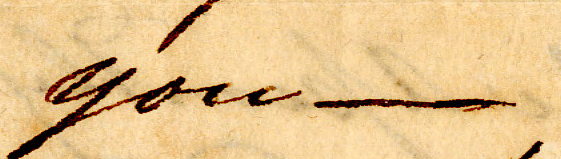you-
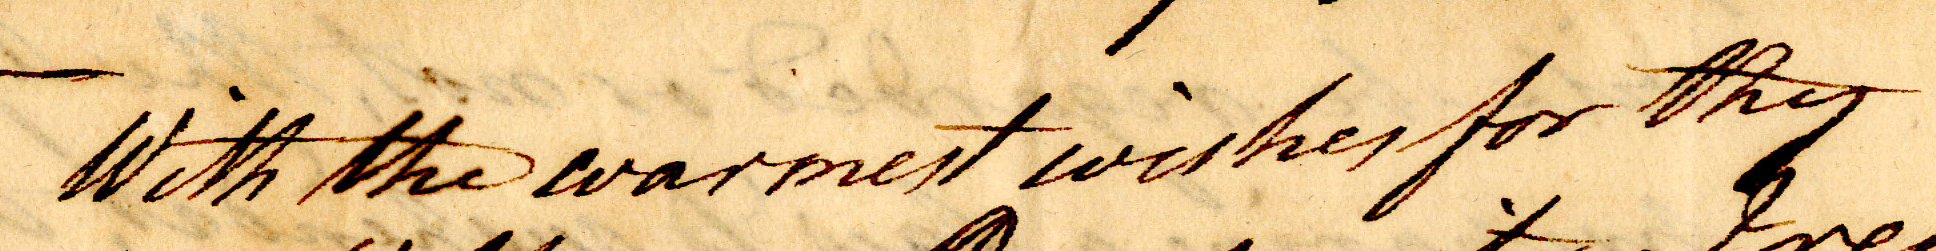With the warmest wishes for thy
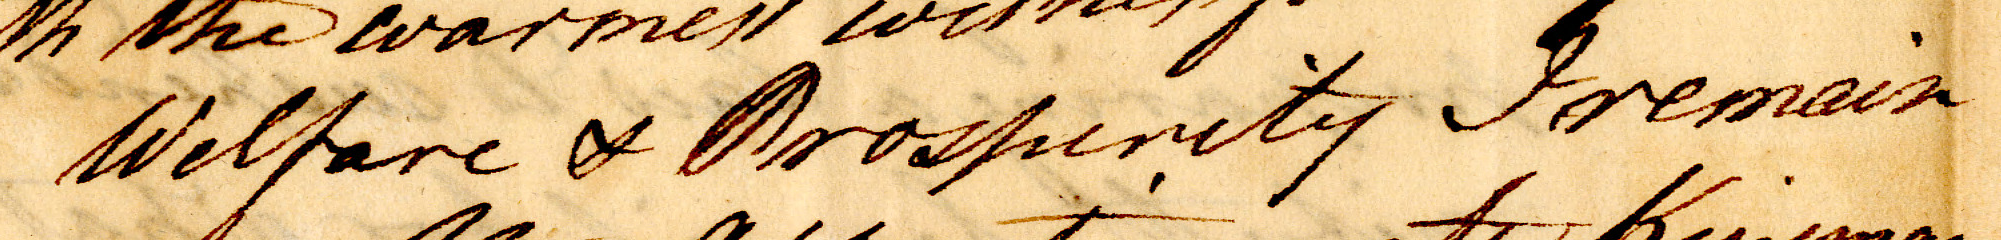Welfare & Prosperity I remain
